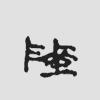陵
